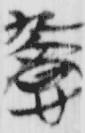憍
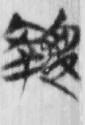執
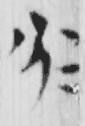小人
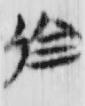於
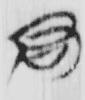君
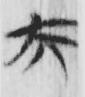夫
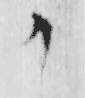人
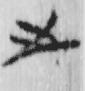之
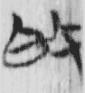{白攴}
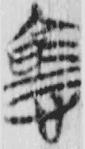愴
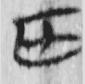甲
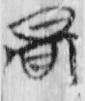晨
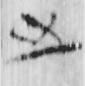之
